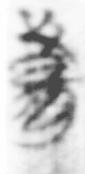○（陽）
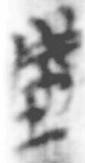城
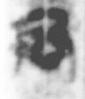君
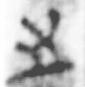之
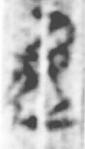○（路）
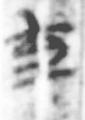車
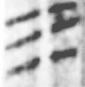三
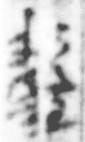𨍱（乘）
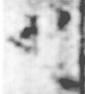屯
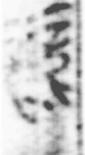麗
